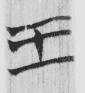王
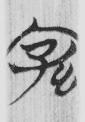{宀孫}
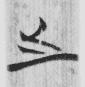之
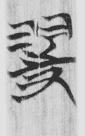{羽寺}
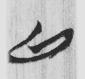㠯（以）
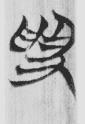受
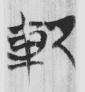{車㔾}
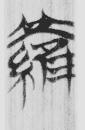羅
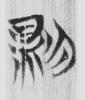則
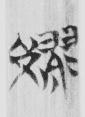{歹翏}
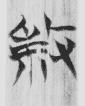殺
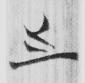之
